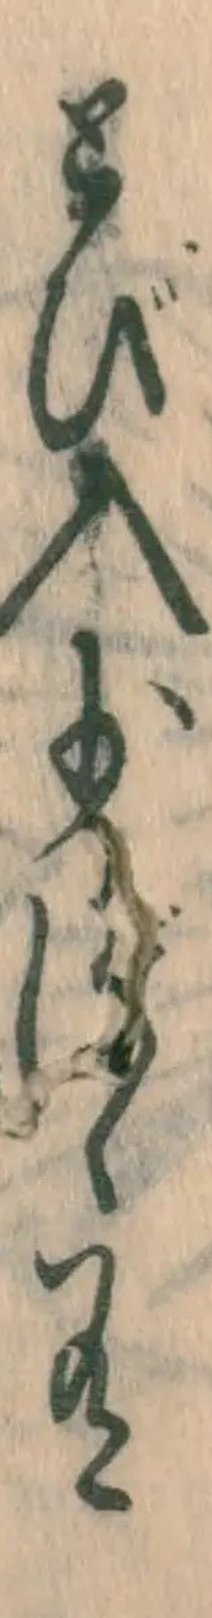とび入少づゝ有
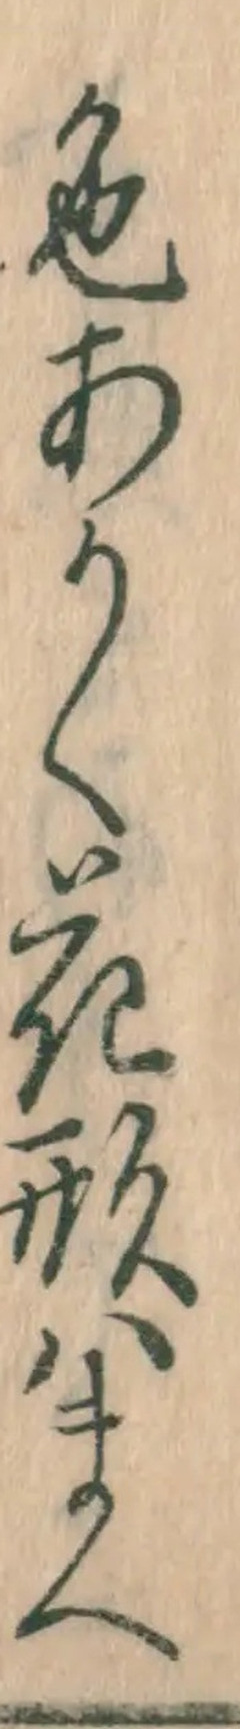色あかく花形はまへ
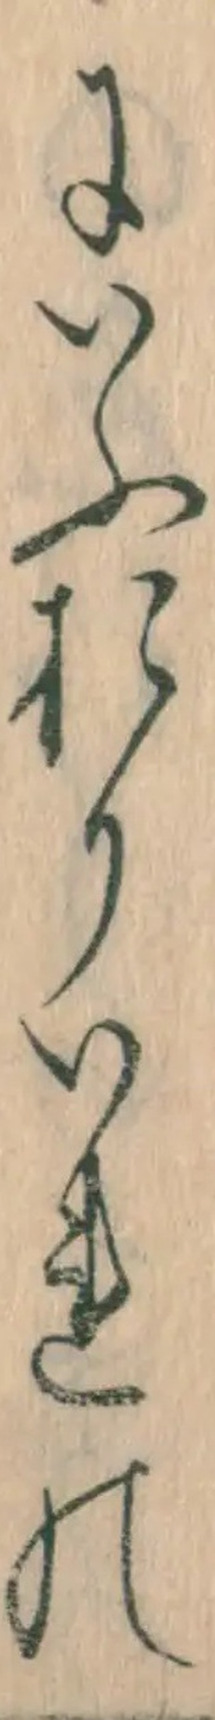にいふおりいれの
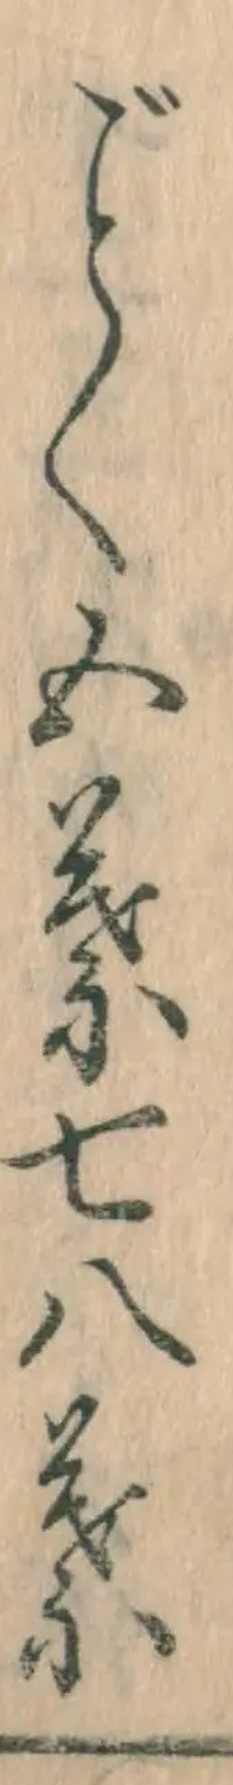ごとく五葉七八葉

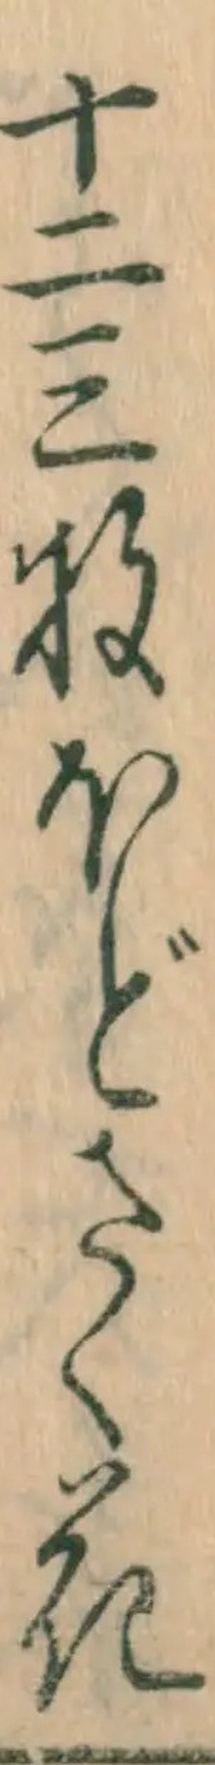十二三枝ほどさく花
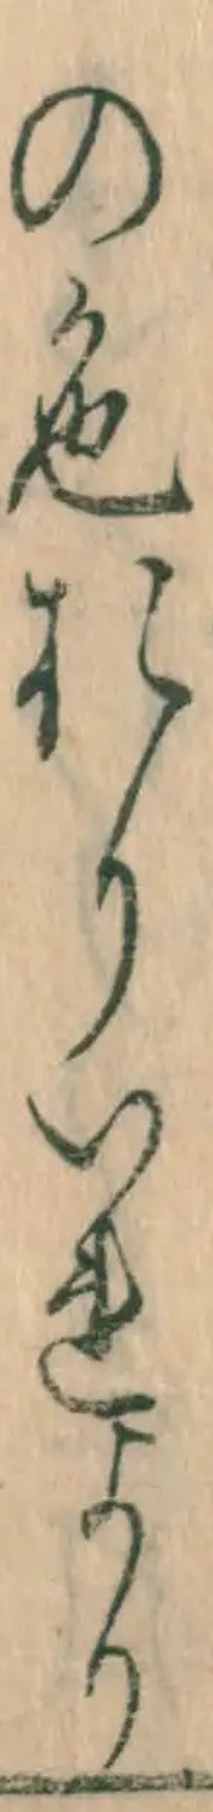の色おりいれより
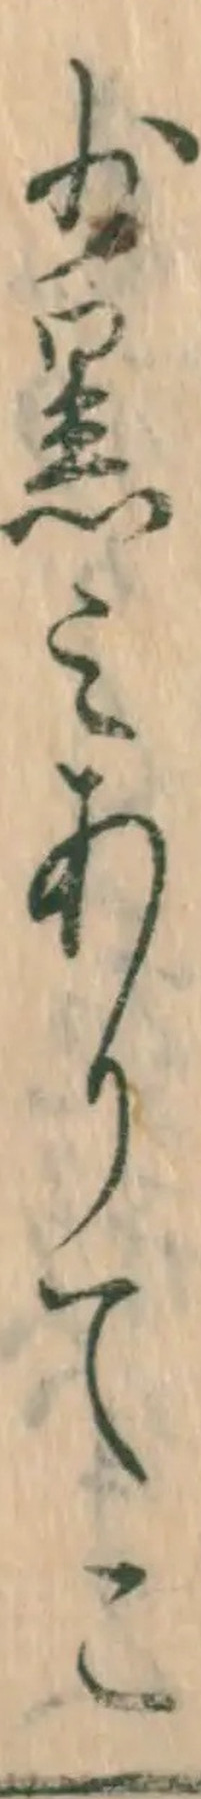少黒みありてこ
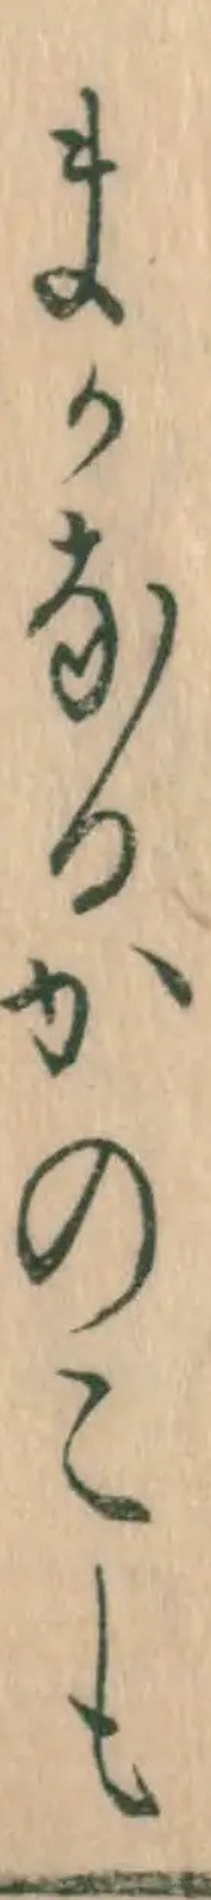まかなるかのこも
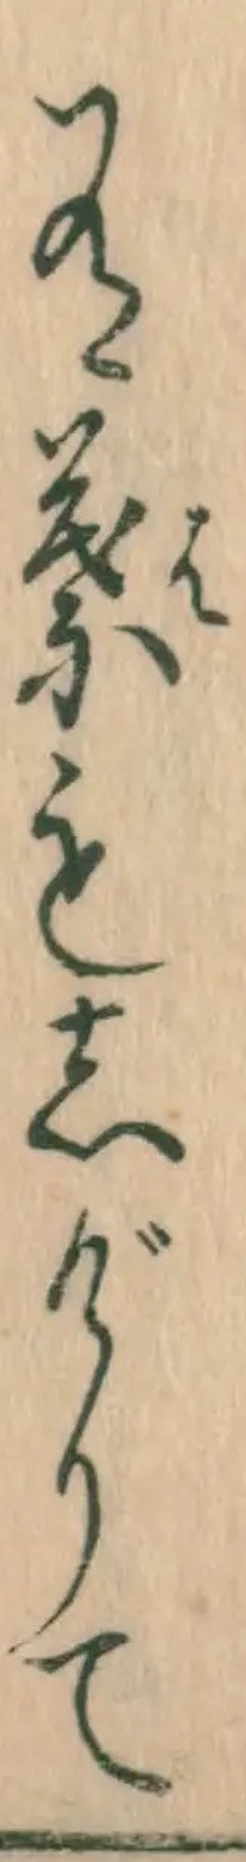有葉もしげりて
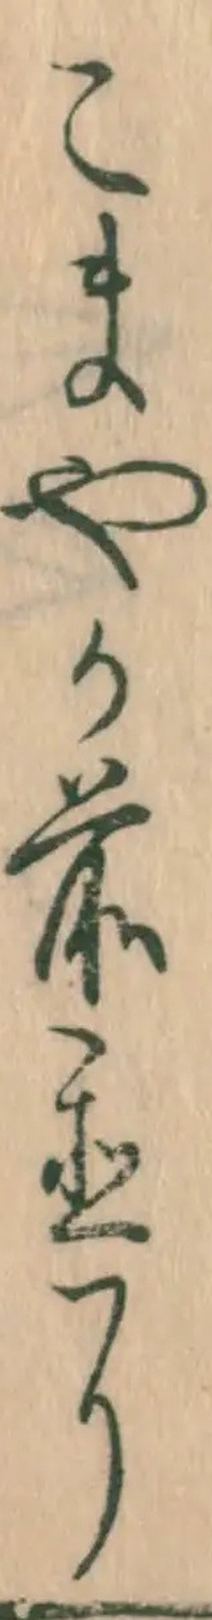こまやか前置に
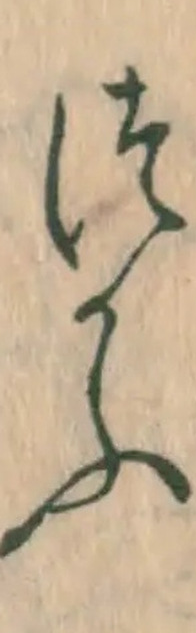つかふ
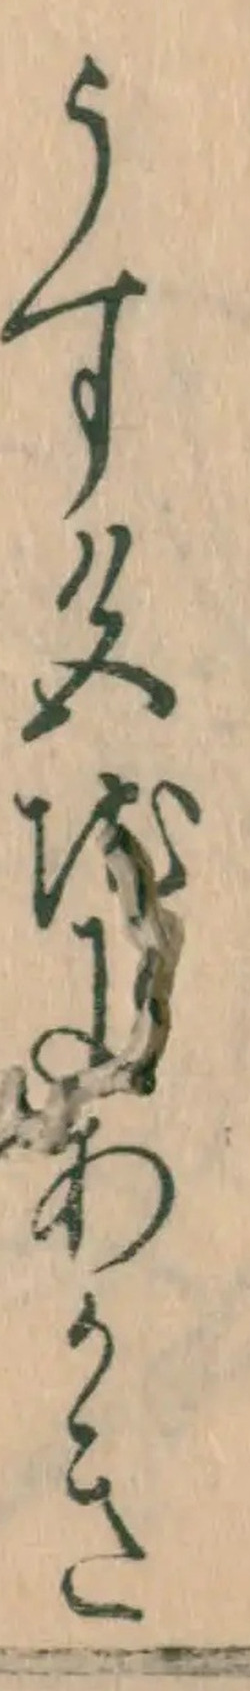うす色地にあかき
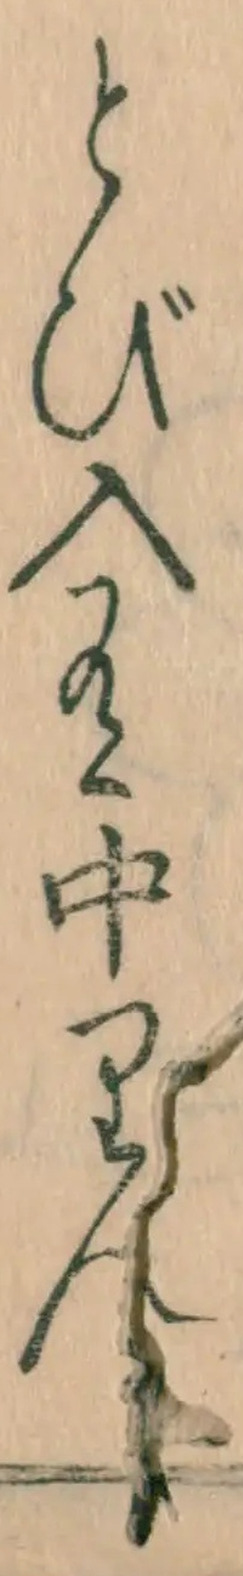とび入有中りん
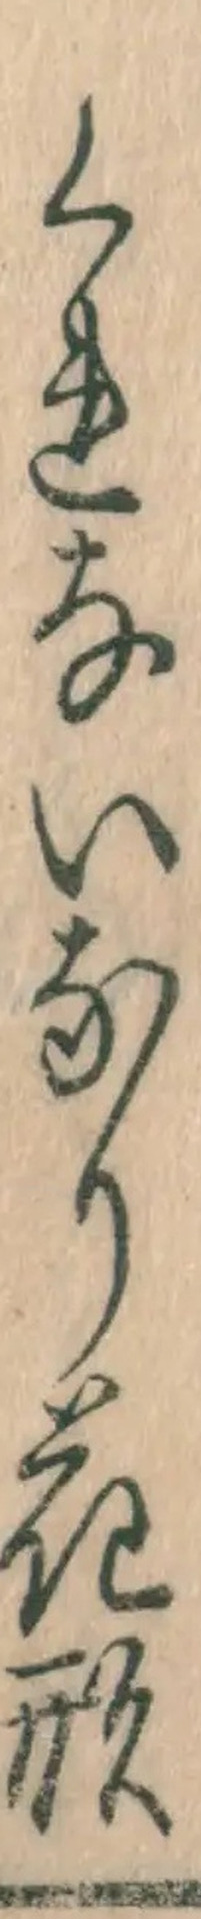くれないなり花形
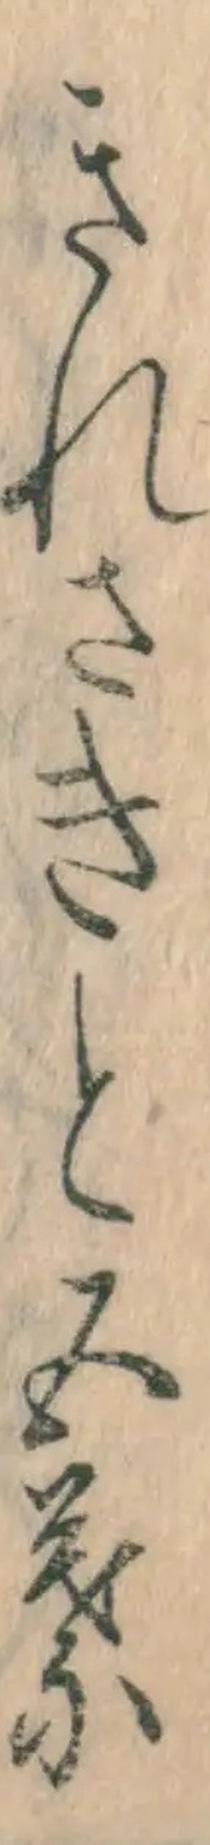きれさきと五葉

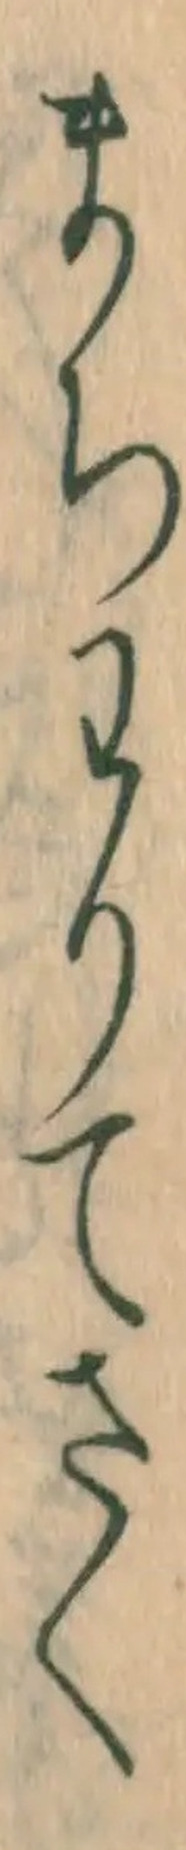まちわりてさく
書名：錦繍枕 5巻. [4]
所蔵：国立国会図書館 National Diet Library, JAPAN
